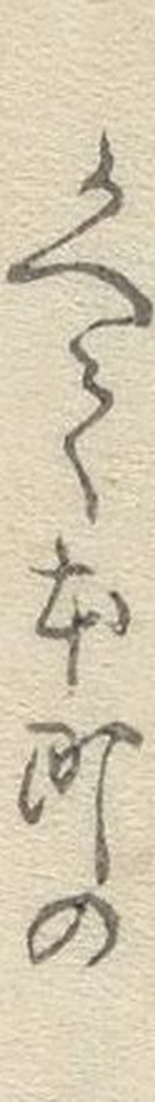かへて本町の
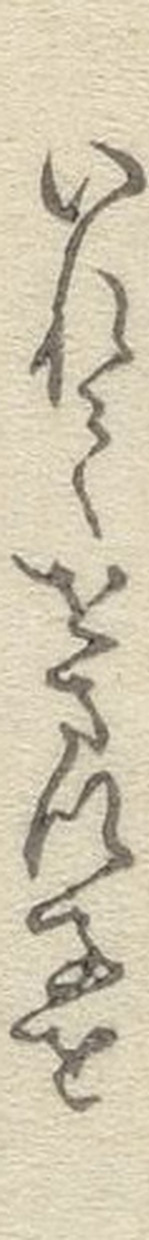いれてをさな子を
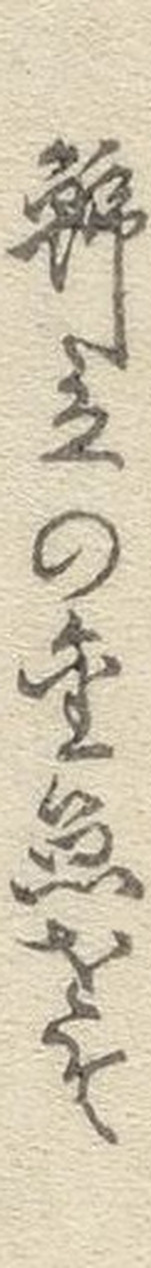鰤立の金魚をそ
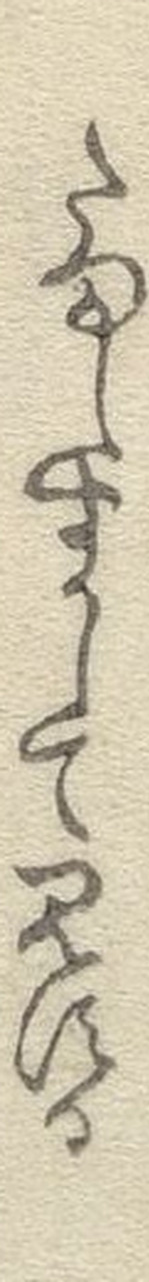たましすかして見する
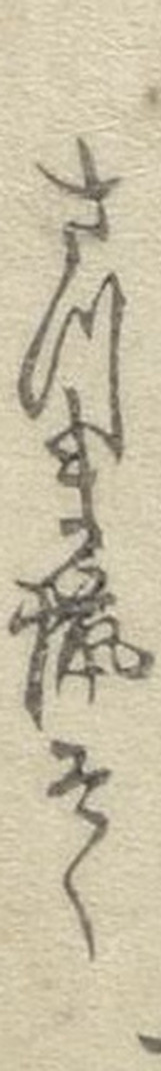さつま蝋そく
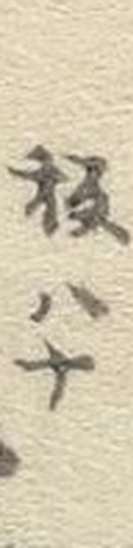板ハナ
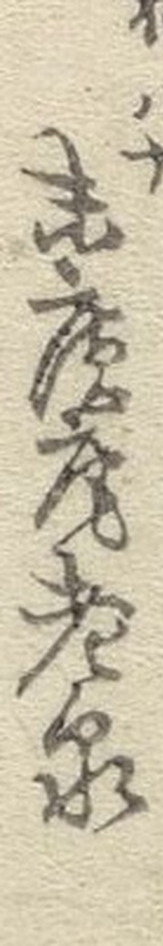末広庵老泉
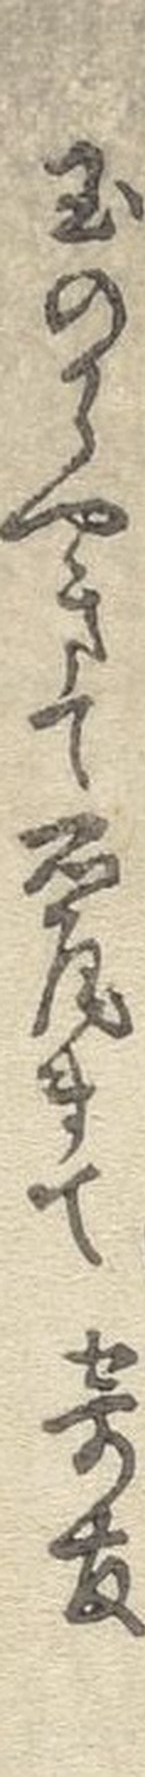玉のかゝやきて石瓦まて皆元廼
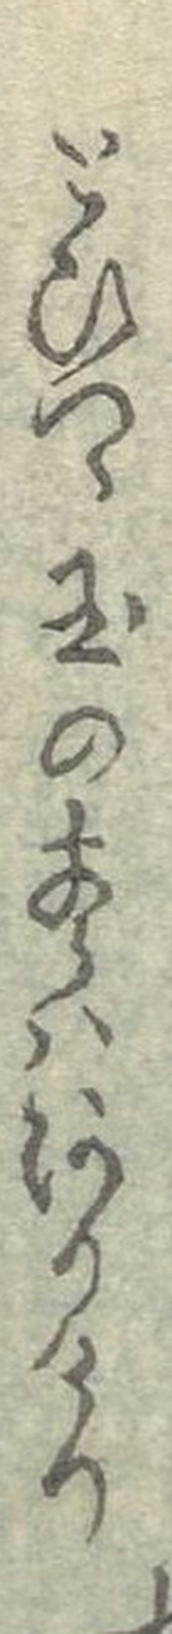とひつゝ玉の声はありけり守安
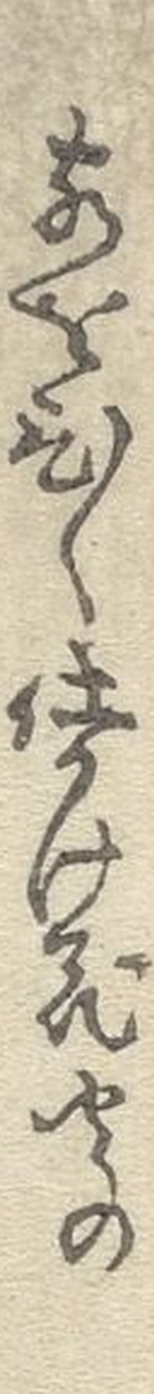をひく仕かけ花火の
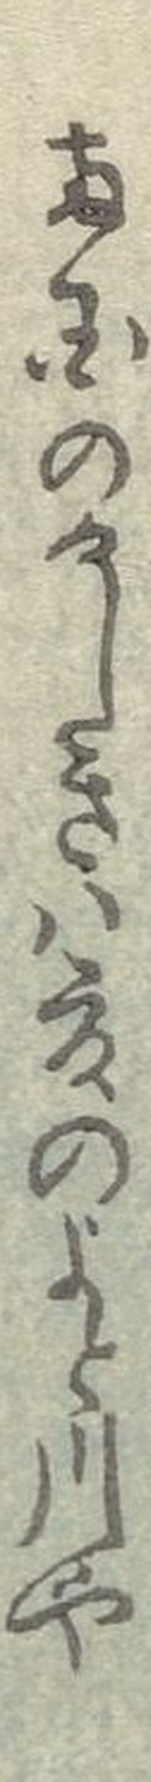両国のけしきは夏のよと川や
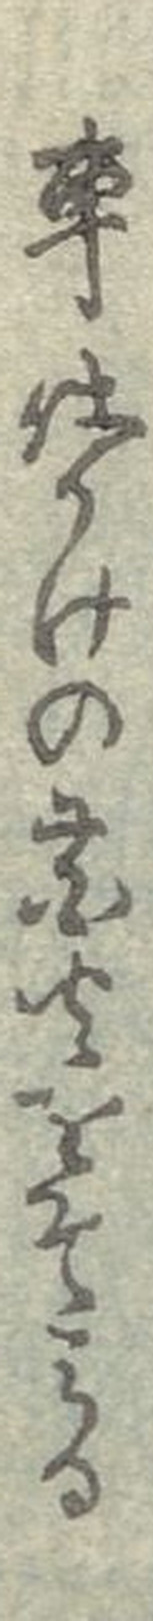傘仕かけの花火をそみる
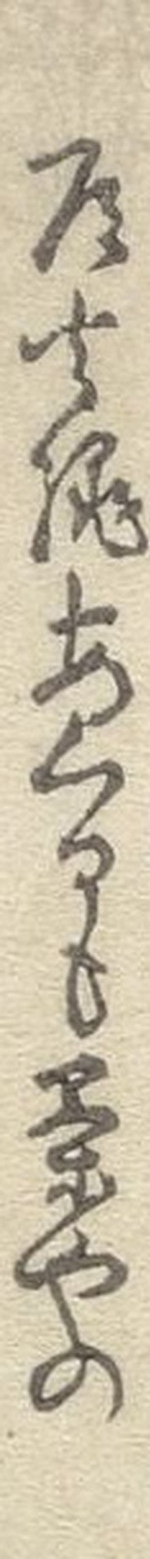道火縄あくるも茶やの
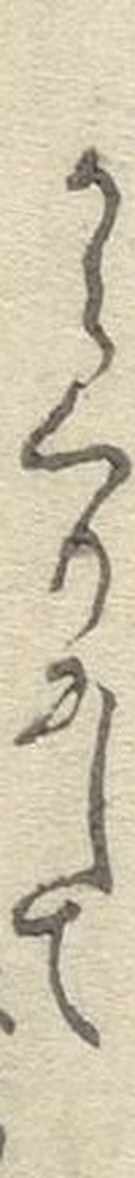からくりにして
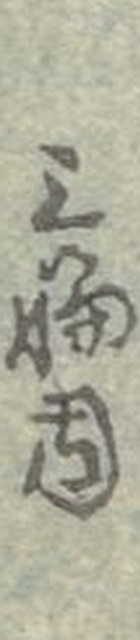三輪園
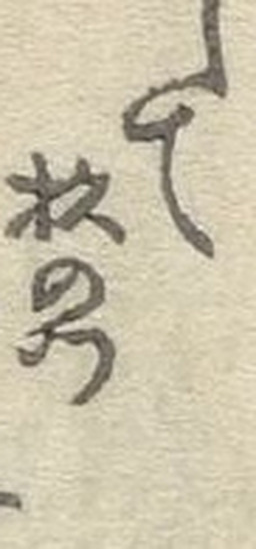杉の門
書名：Picture Album of People with Kyōka (Light Verse) (Kyōka shiki jinbutsu 狂歌四季人物)
